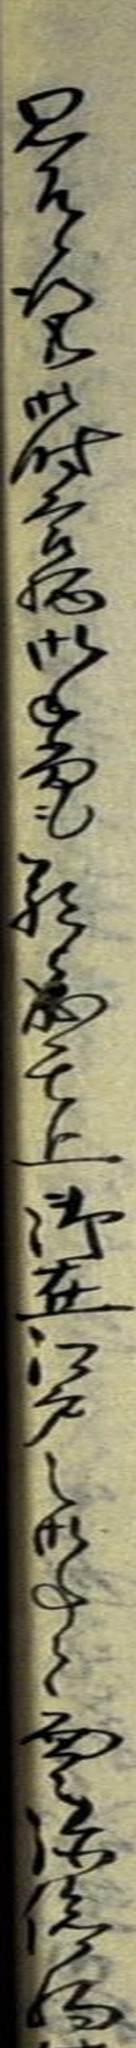思召候得共御時節柄御手当も難被成其上御在江戸之御事ニて面々弥倹約仕
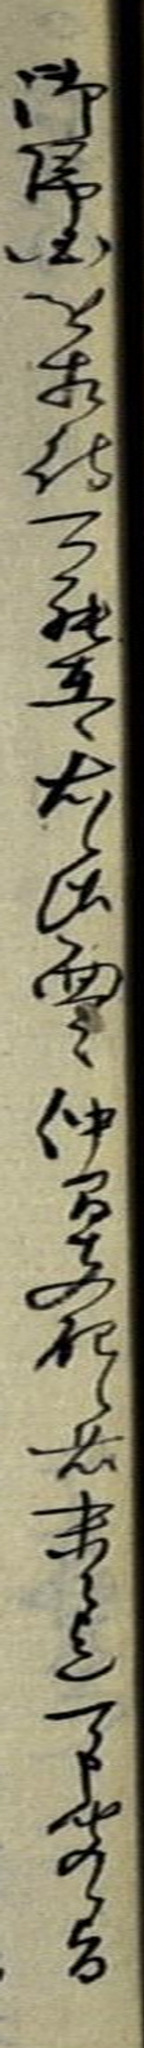御帰国を相待可罷在候右之趣面々仲間支配之者末々迄可申聞候旨
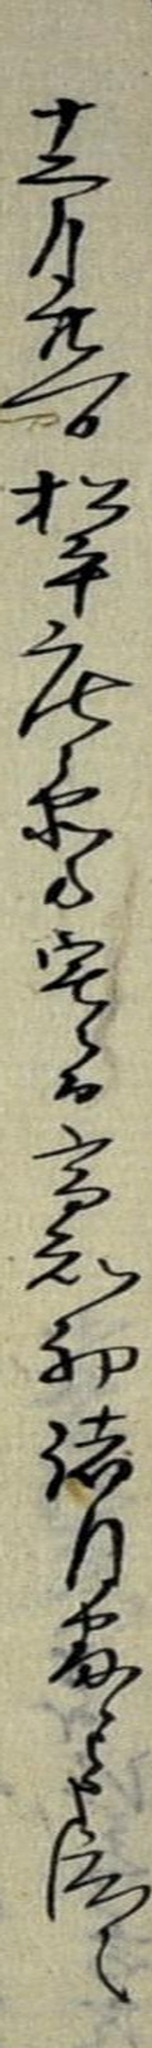十二月廿一日松平庄兵衛方宅ニ而高知初諸月番へ被申渡之
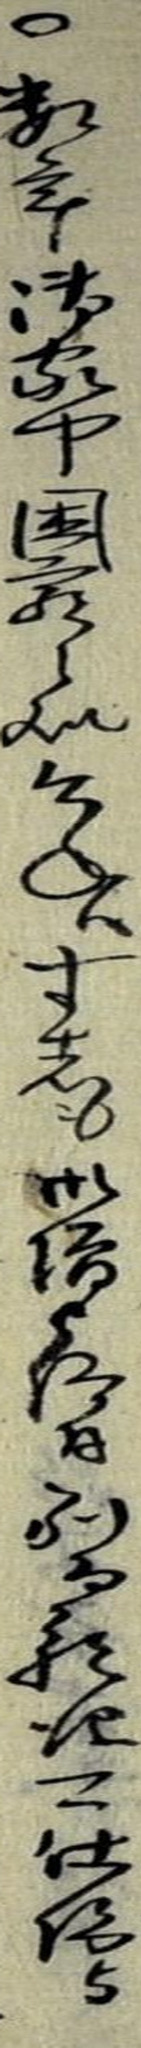〇数年御家中困窮之処今年ハ寸志も御増被仰付別而難儀可仕儀与
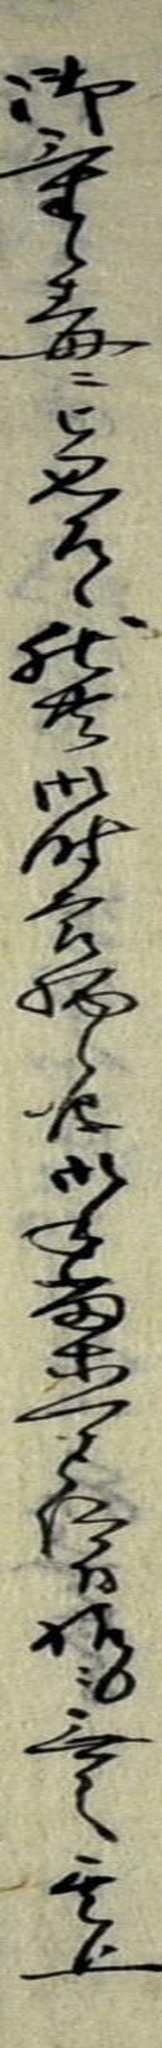御気之毒ニ被思召候然共御時節柄之儀御手当等可被仰付様も無之其上
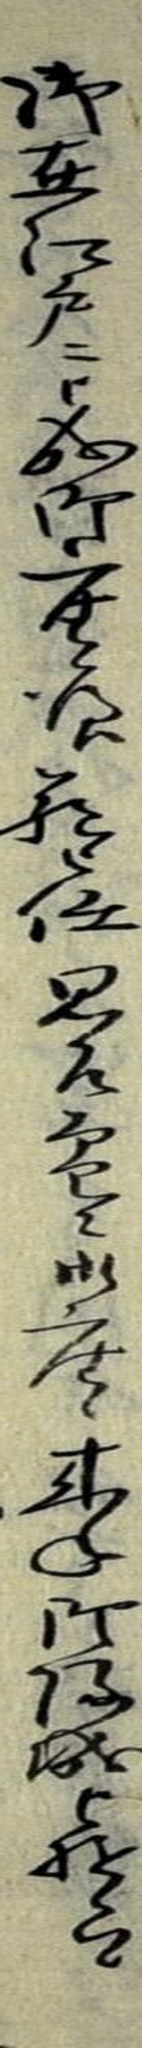御在江戸ニ被成御座候得ハ難被任思召而已ニ御座候来年御城被遊候ハヽ
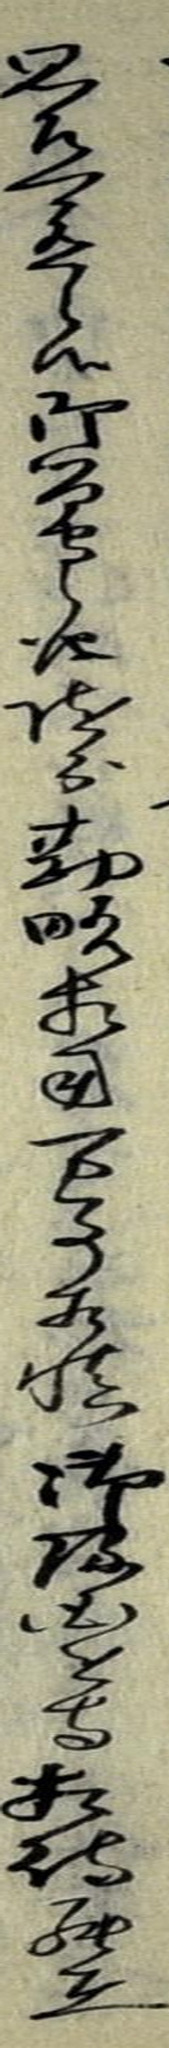思召可有之候御留守之儀随分勘略相用万事相慎御帰国を専相待罷在
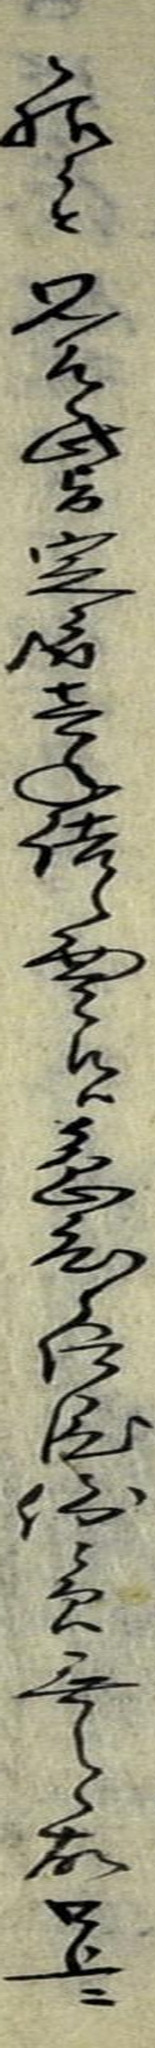候様ニと思召候此旨定府壱年詰之面々江ハ急度被仰渡儀ニ而ハ無之候故口上ニ
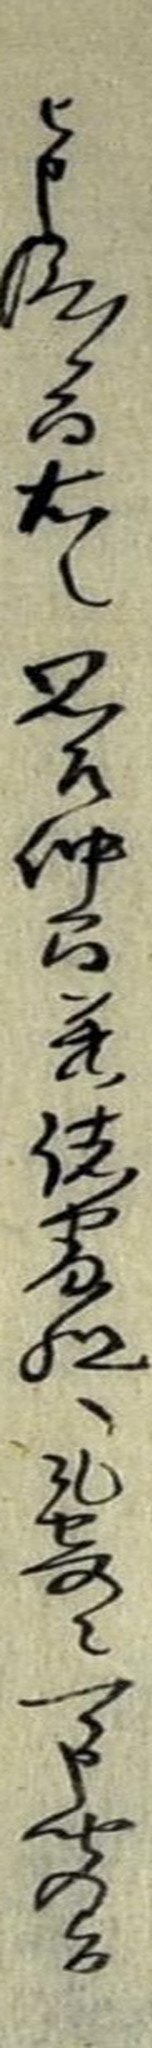被申渡候間右之思召仲間并諸番組へも寄々可申聞旨
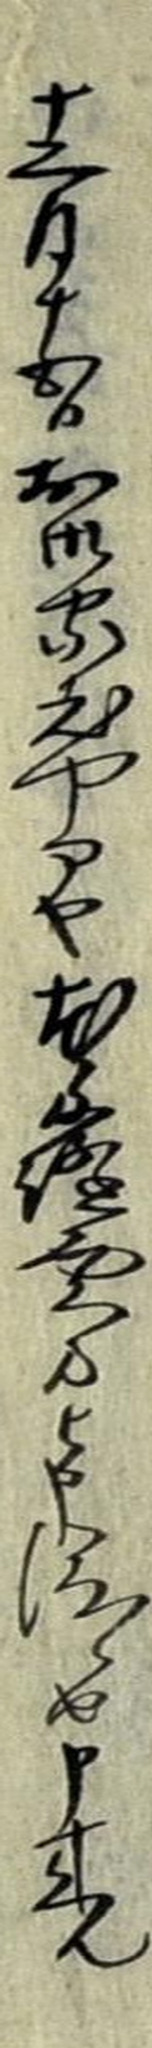十二月十五日於御家老中部屋本多縫殿方被申渡候由申来ル
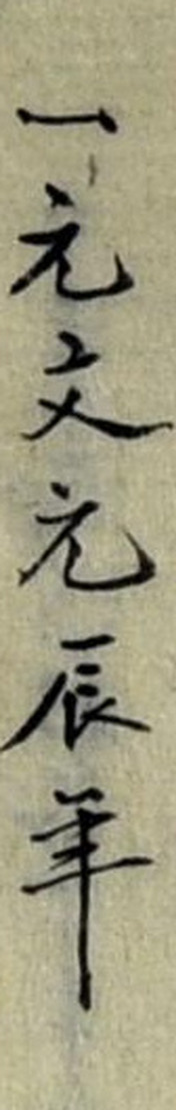一元文元辰年
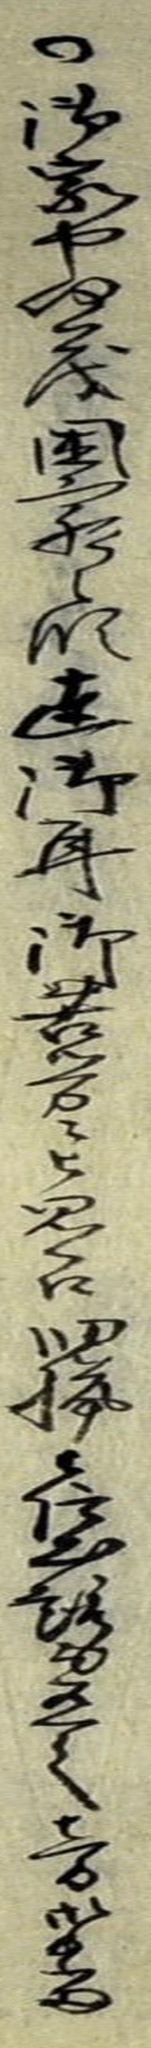〇御家中何茂困窮之段達御耳御苦労ニ被思召旧臘被仰出趣も有之旁御手当
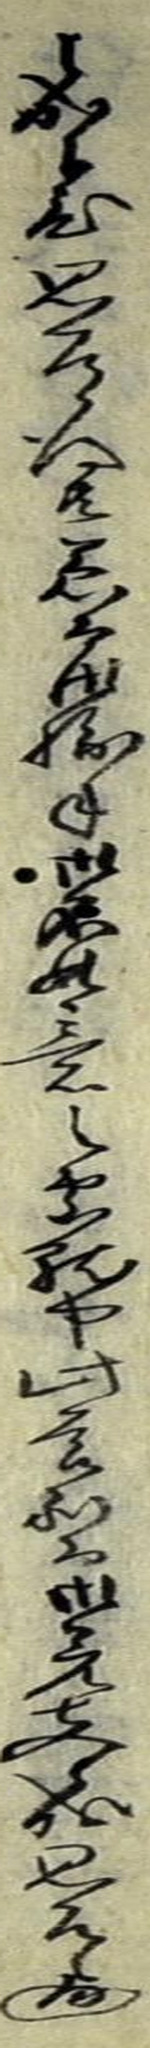被成下度思召候得共兼而御勝手御不如意之処就中此節別而御差支被成思召之通
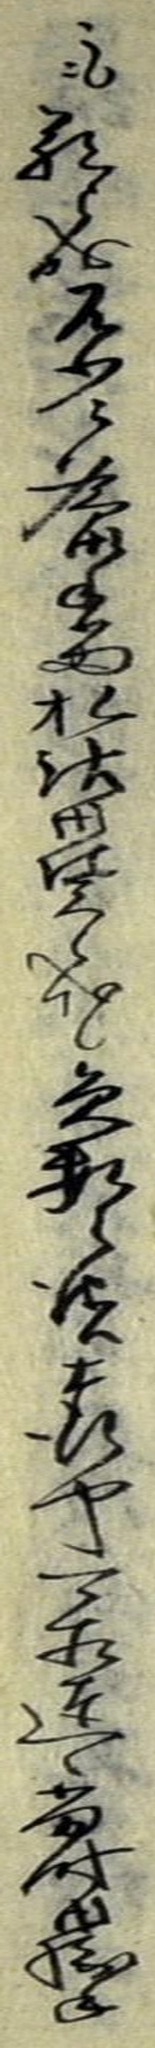ニも難被成乍少々為御手当札銀御貸被成候員数之儀ハ奉行中可相達候当時御勝手

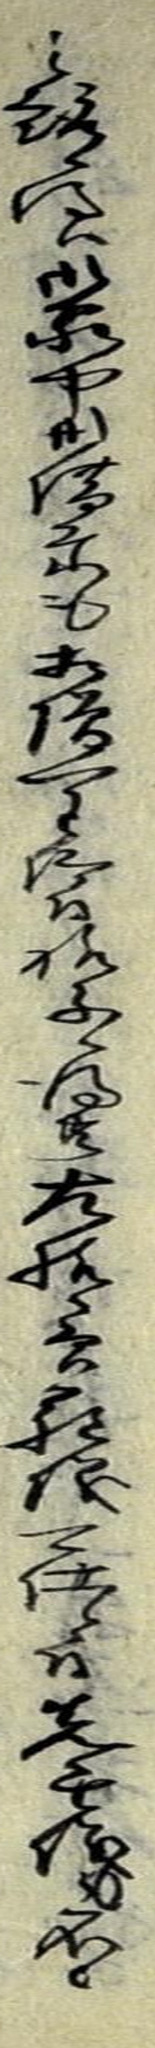之趣候得ハ御家中御借米も相増可被仰付様子候得共左様候而ハ難儀可仕候ニ付先其儀も不被
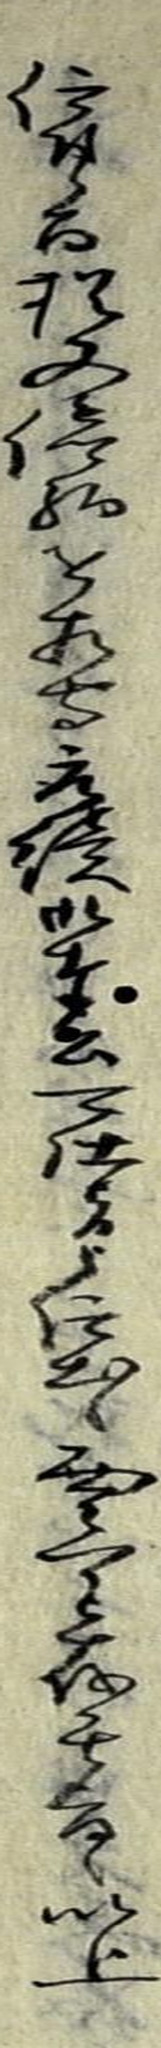仰付候間猶又倹約を相守取続御奉公可仕旨被仰出候面々可被存其旨候以上
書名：命令之部 一
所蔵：福井県文書館 Fukui Prefectural Archives
